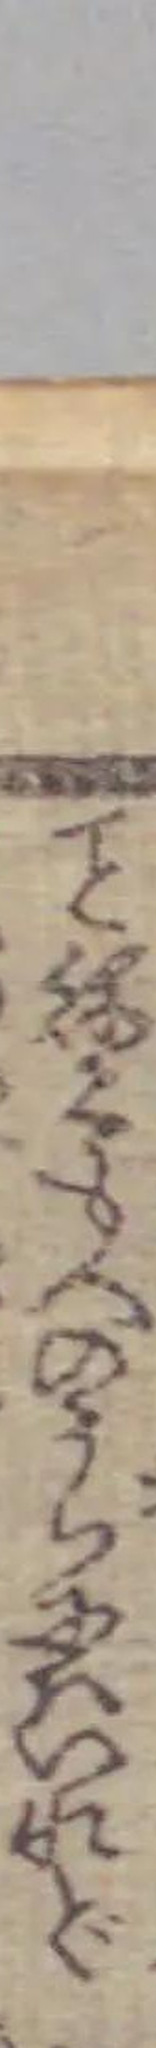ことねこも人のうちにはいれど
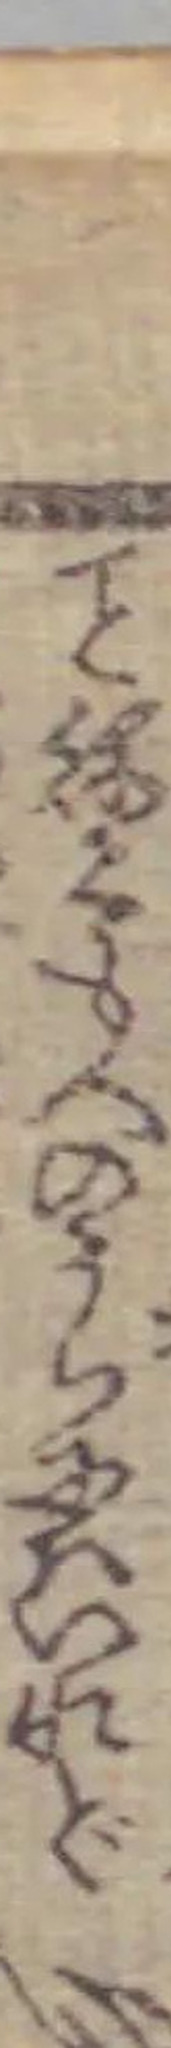ことねこも人のうちにはいれど
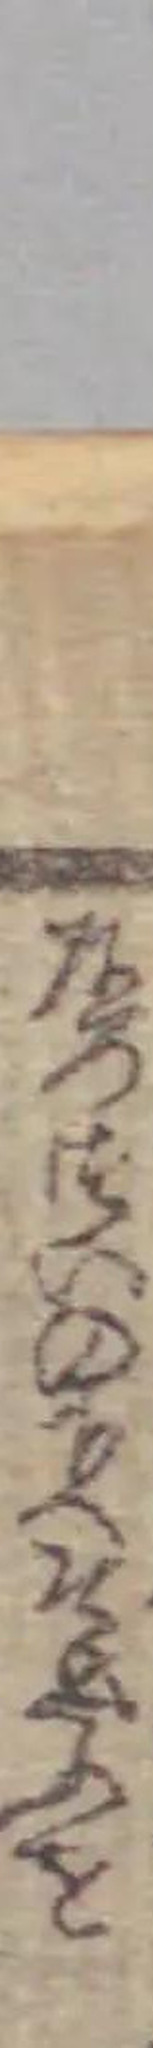へつついの下へそさふを
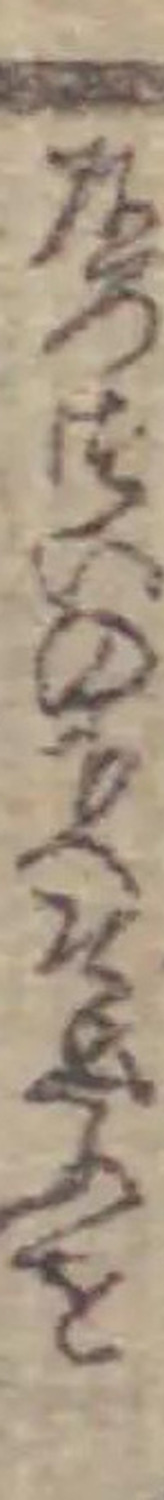へつついの下へそさふを
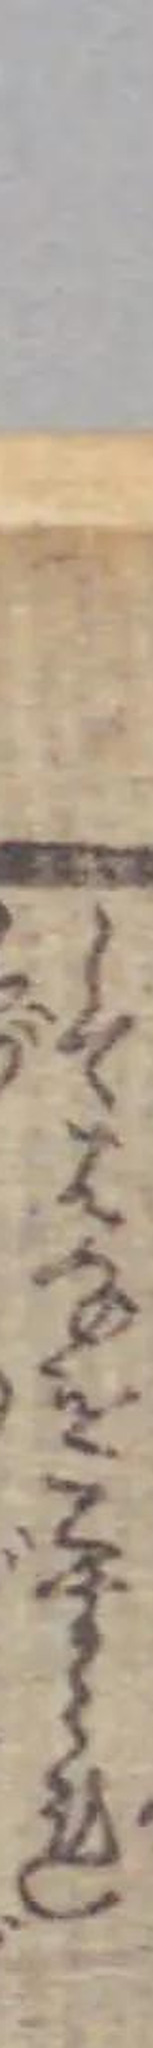してはなをこすられ
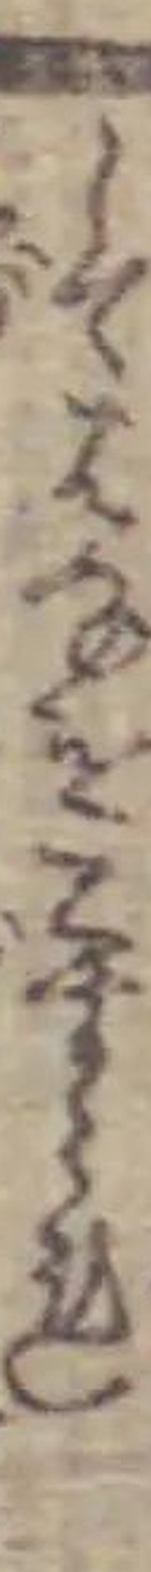してはなをこすられ
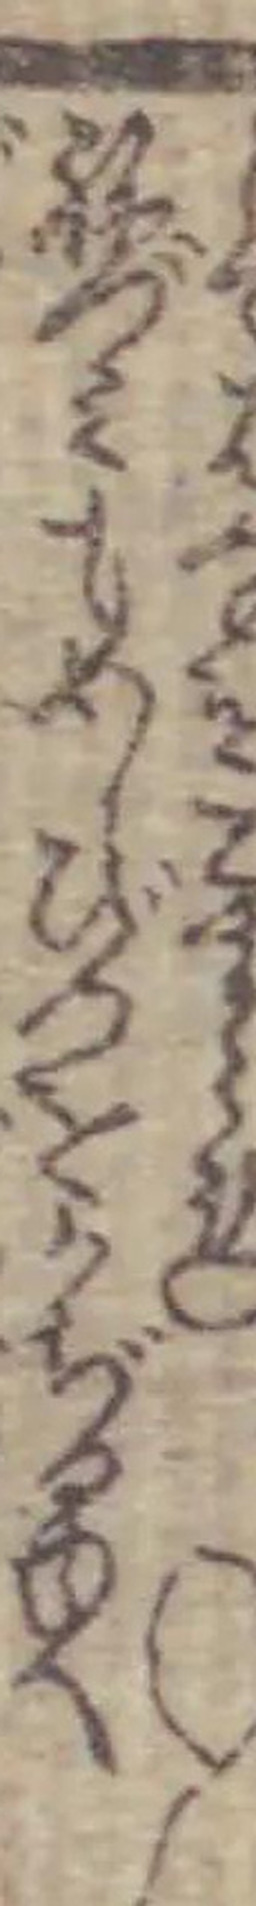ねづみもめしびつをかぢるゆへ
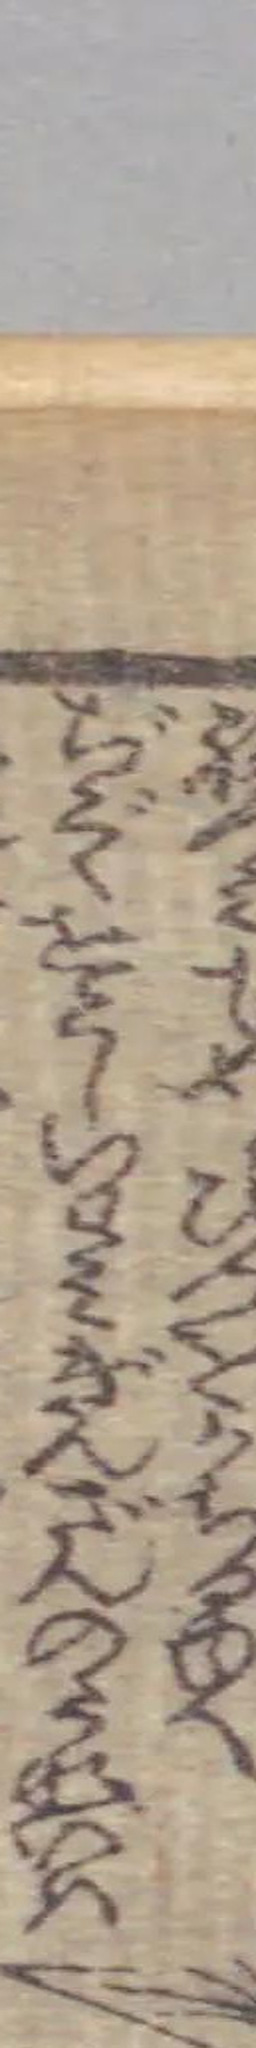ぢごくをこしいわみぎんざんのうれいは
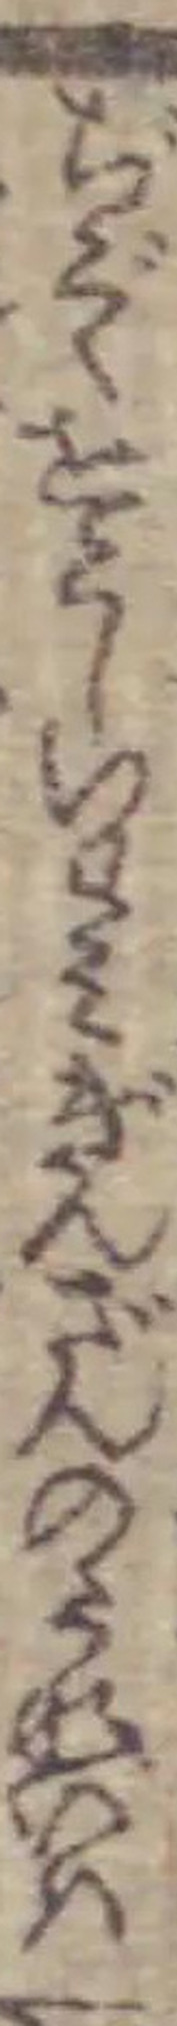ぢごくをこしいわみぎんざんのうれいは
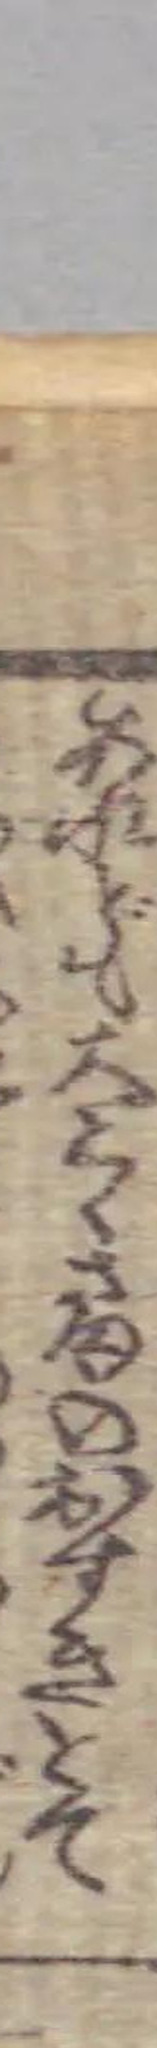あれども大こくさまのおすきとて
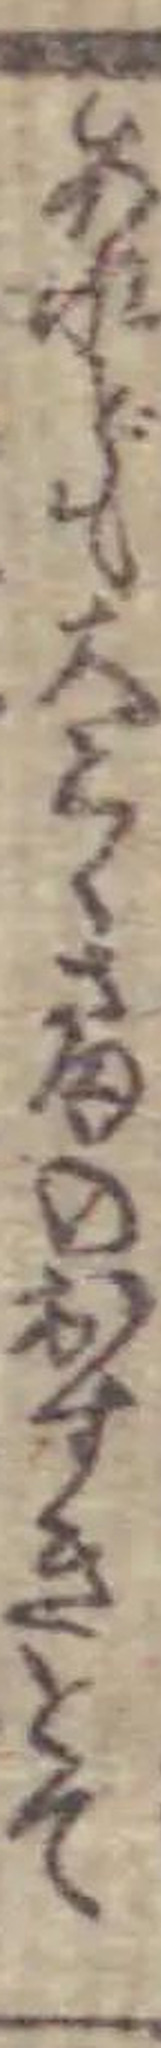あれども大こくさまのおすきとて
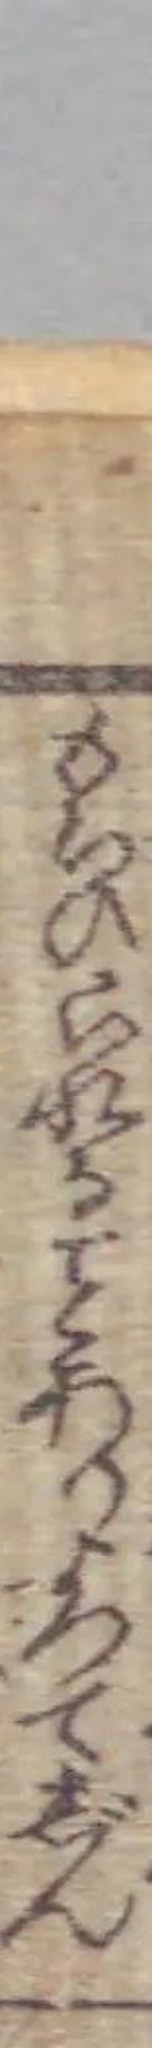もちひられることありよつてじん
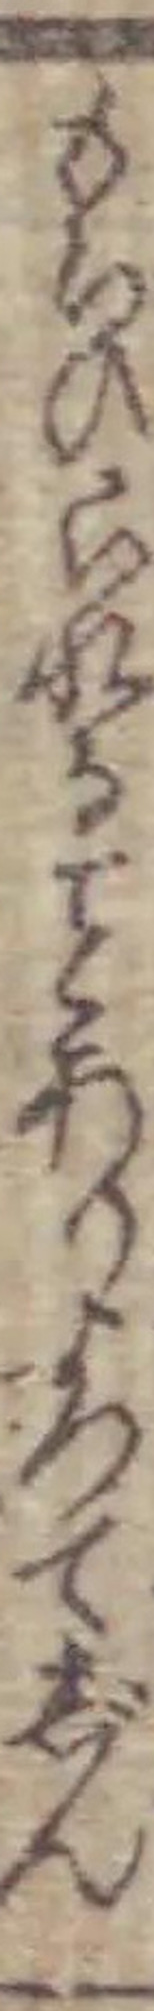もちひられることありよつてじん
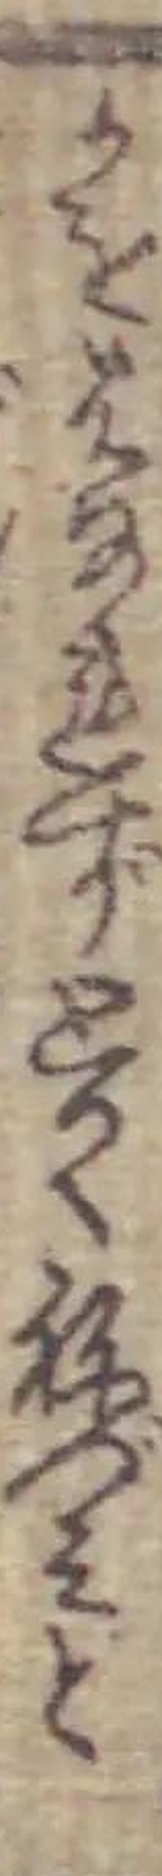かをはなれずとかくねづみと
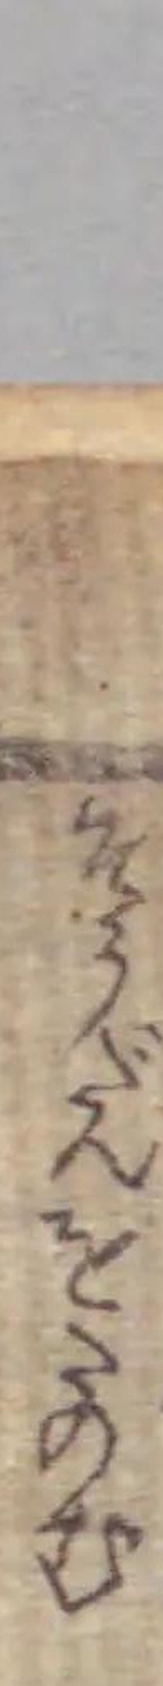そうだんをたのむ
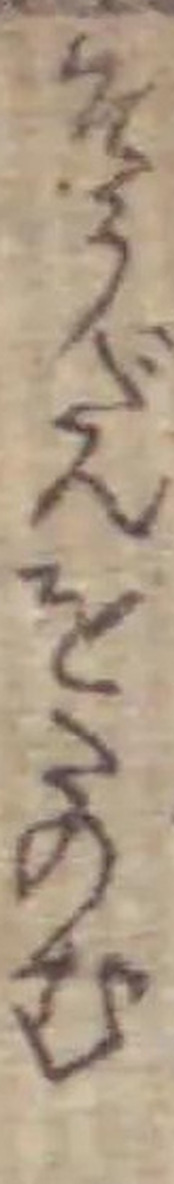そうだんをたのむ
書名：化物昼寝鼾 2巻
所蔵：国立国会図書館 National Diet Library, JAPAN
